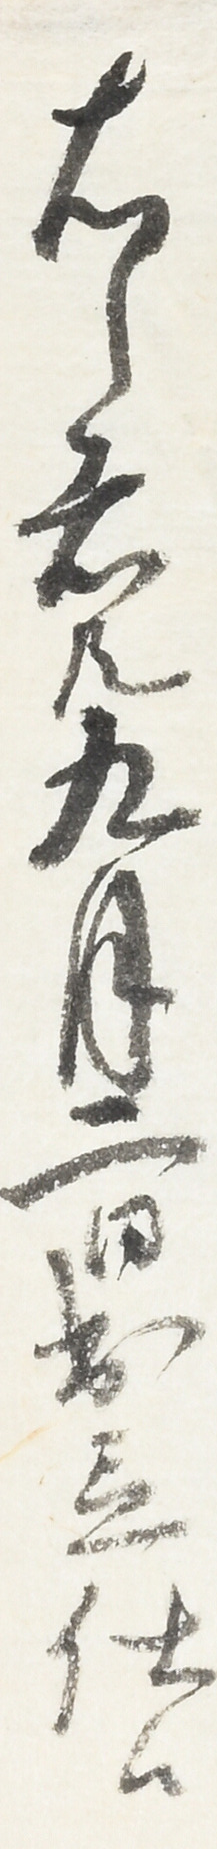右之者共九月二日出立仕候

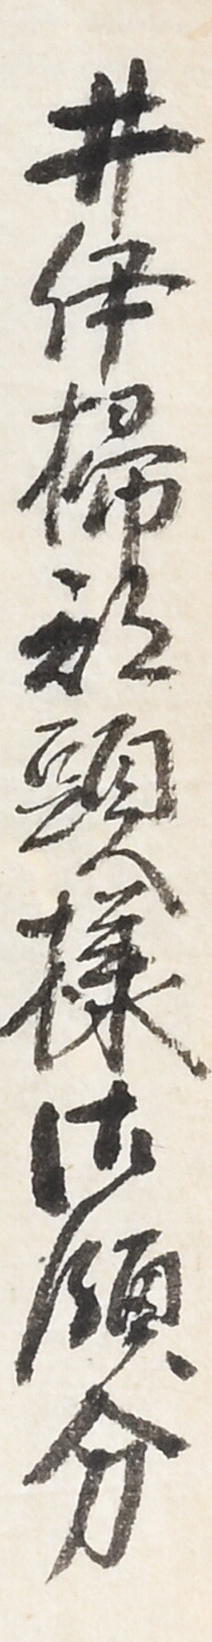井伊掃部頭様御領分
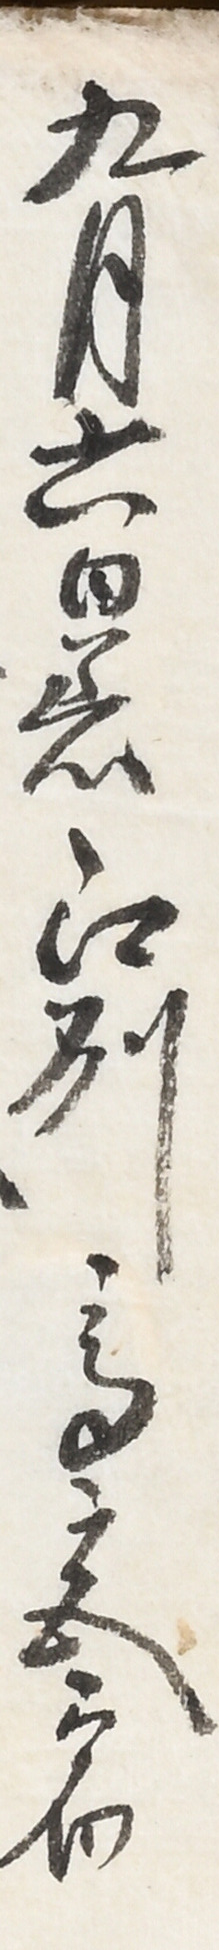九月六日着江州高宮宿
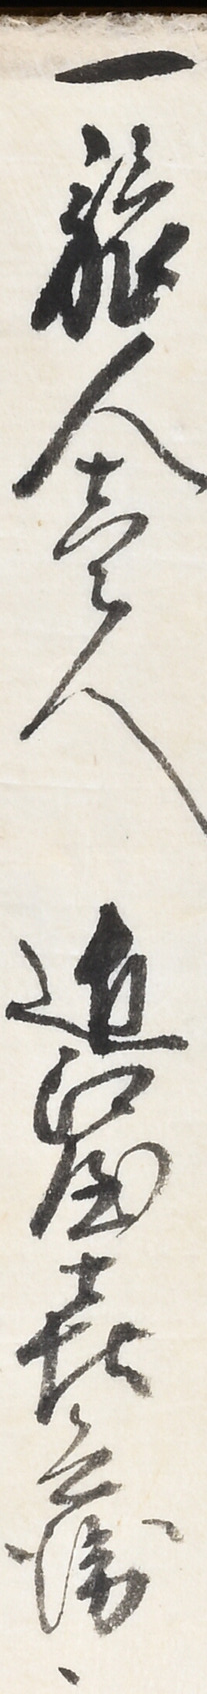一旅人壱人近江屋喜兵衛・
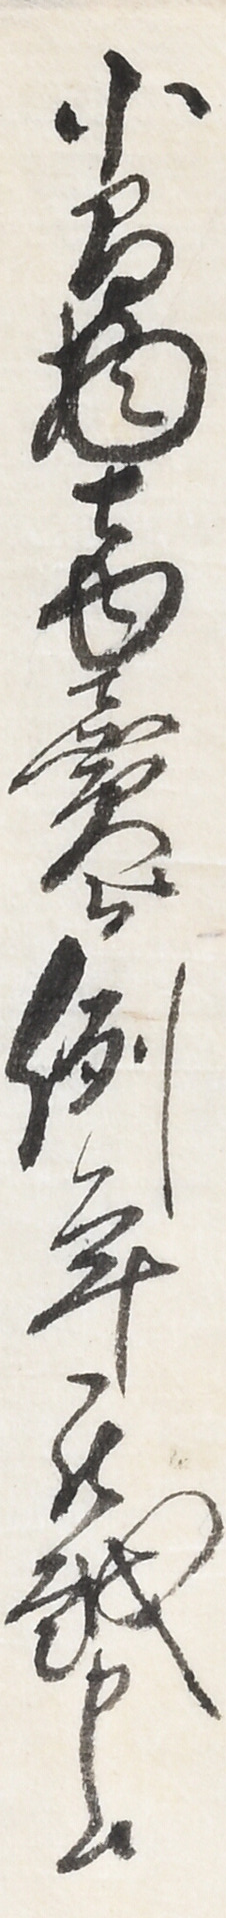小間物商売ニ而例年罷越申候
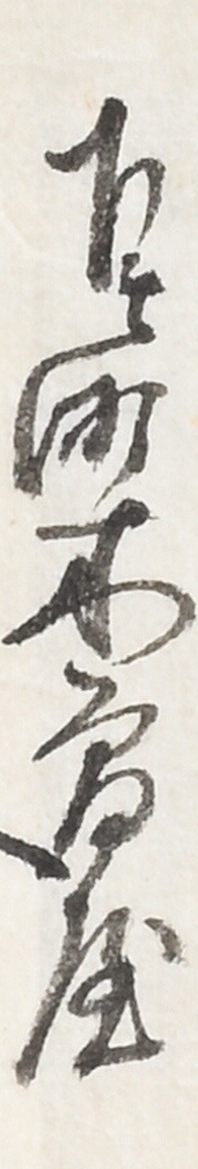下モ町木曽屋
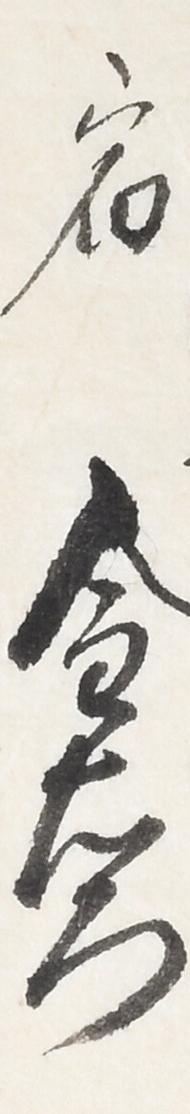宿金右衛門
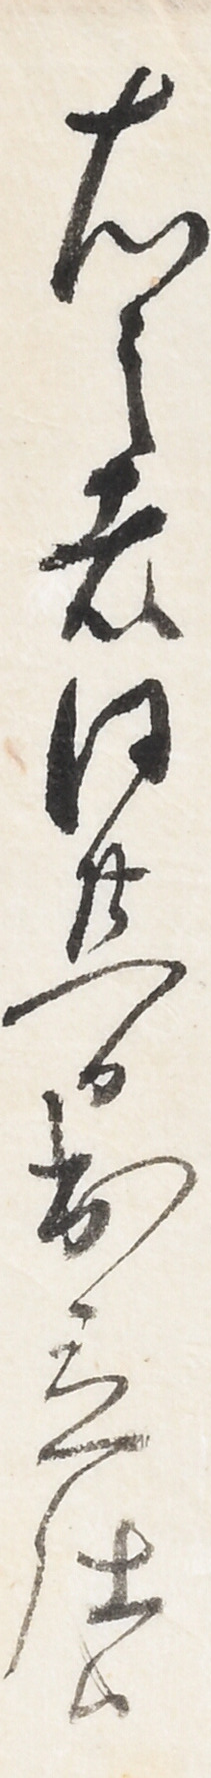右之者同廿一日出立仕候
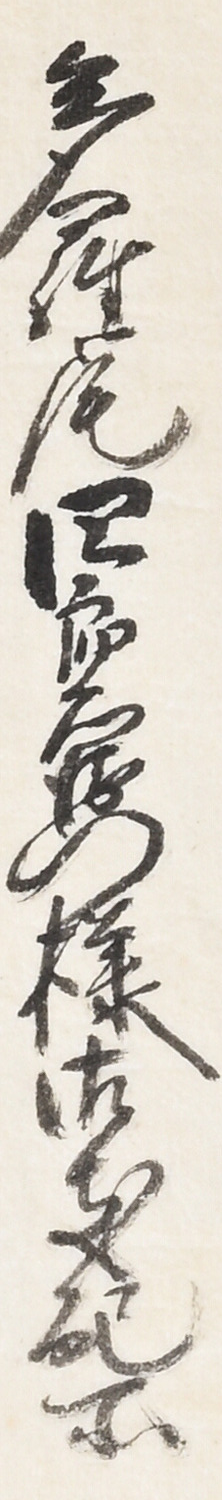多羅尾四郎右衛門様御支配所
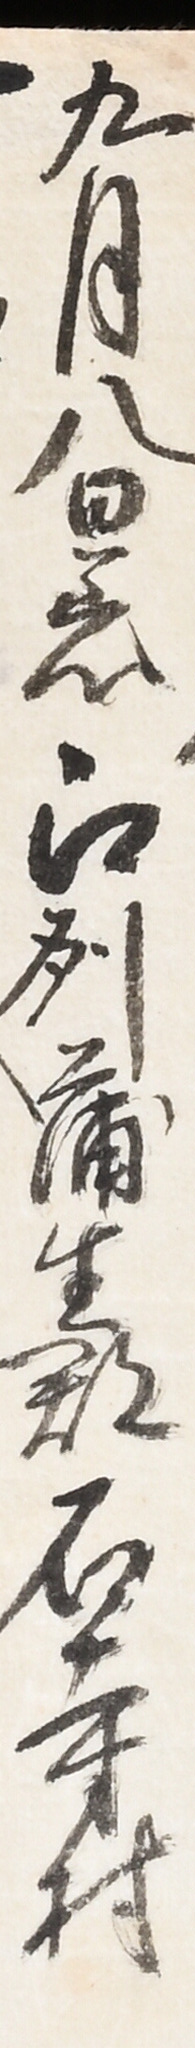九月八日着江州蒲生郡石寺村
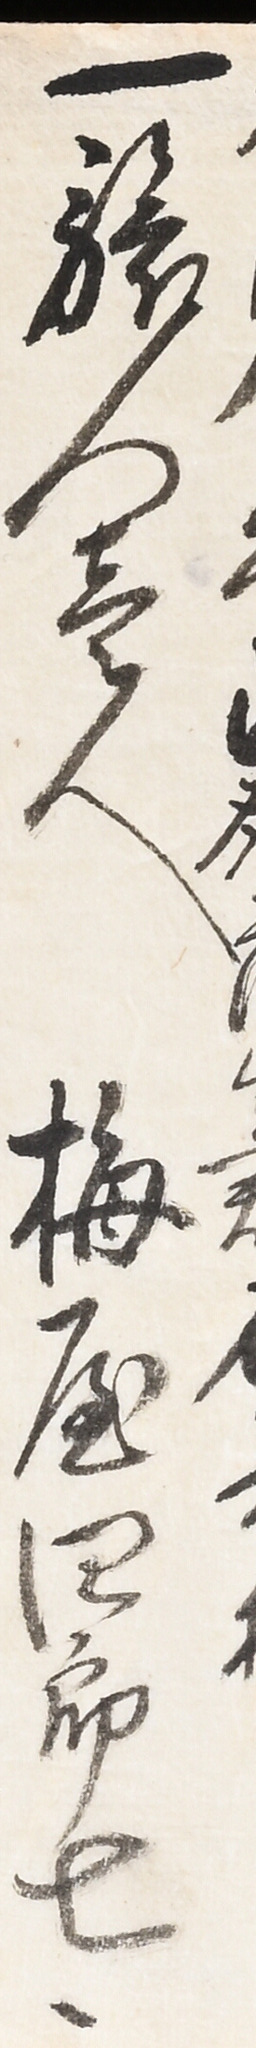一旅人壱人梅屋四郎七・
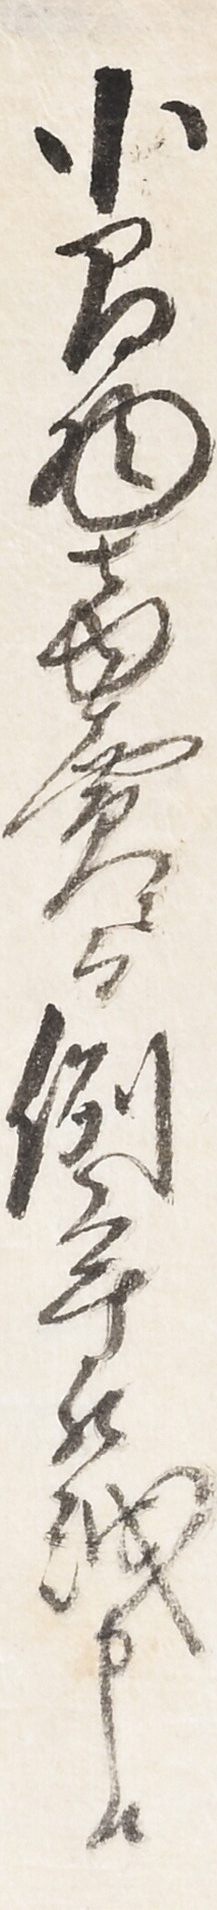小間物商売ニ而例年罷越申候
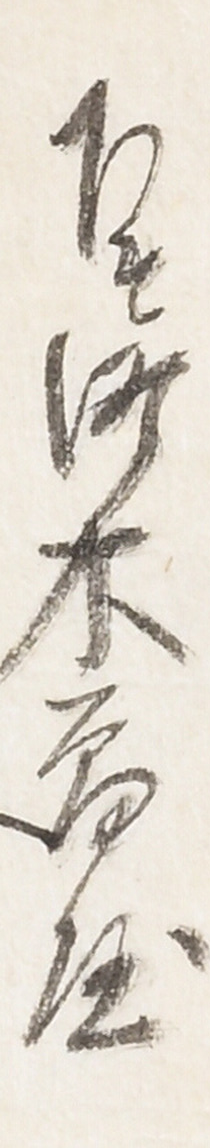下モ町木曽屋
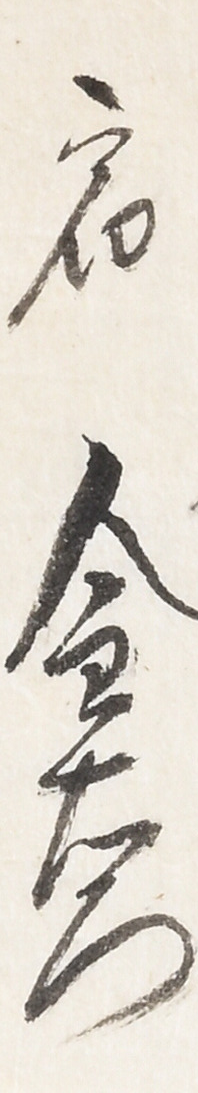宿金右衛門
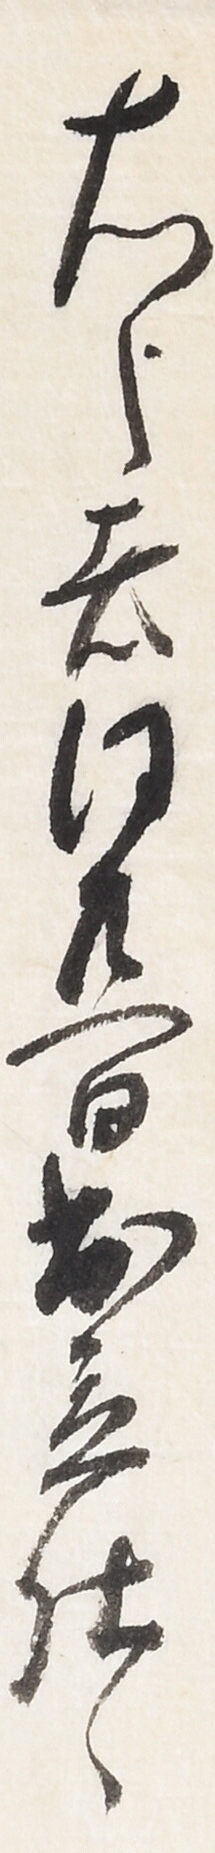右之者同廿一日出立仕候
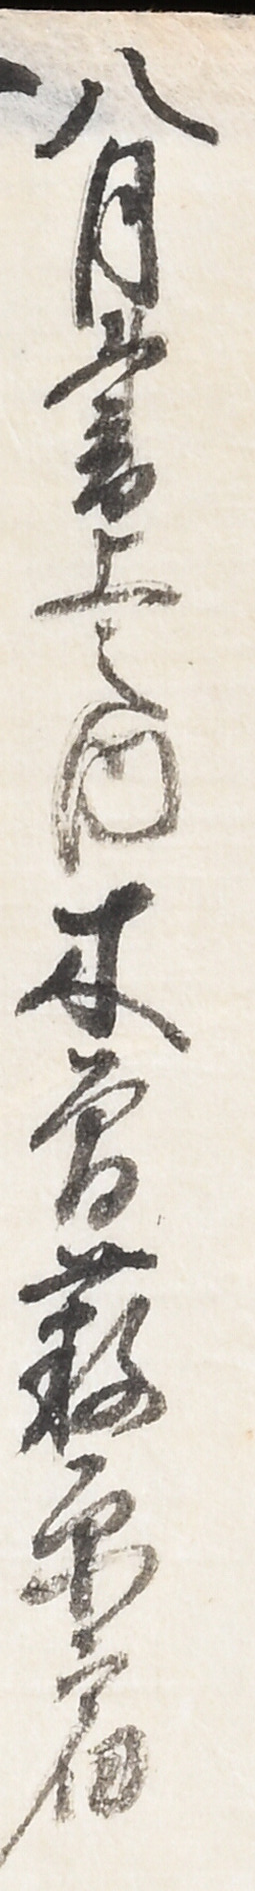八月書上之内木曽藪原宿
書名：旅人泊控帳
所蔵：伊那市立高遠町図書館・合同会社AMANE
